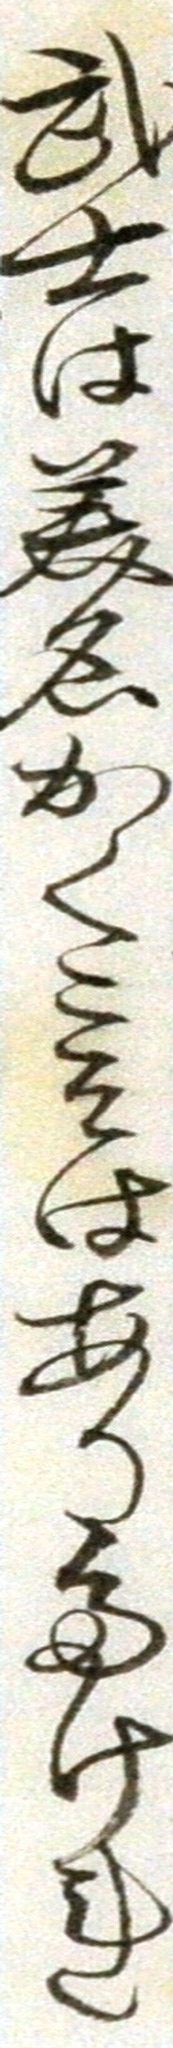武士は美名かくこそはあり多け連
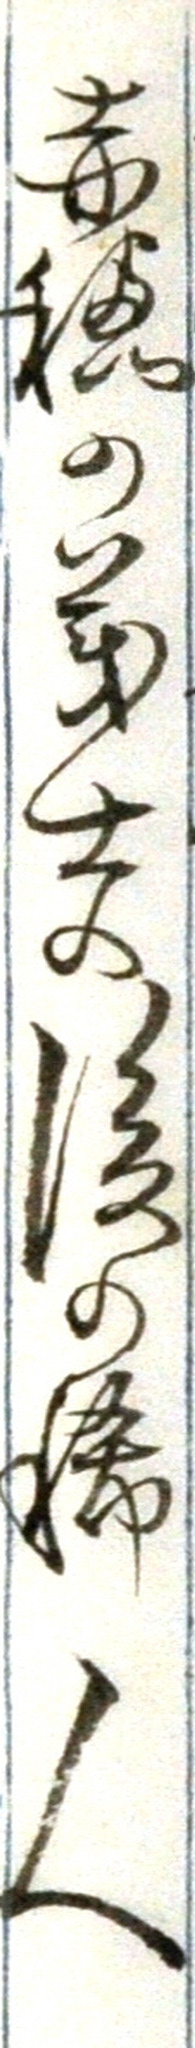赤穂の義士の後の稀人

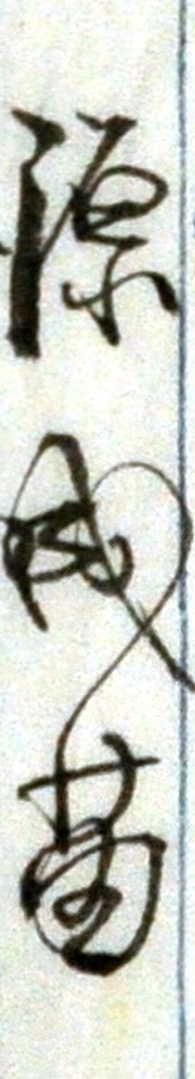源成苗
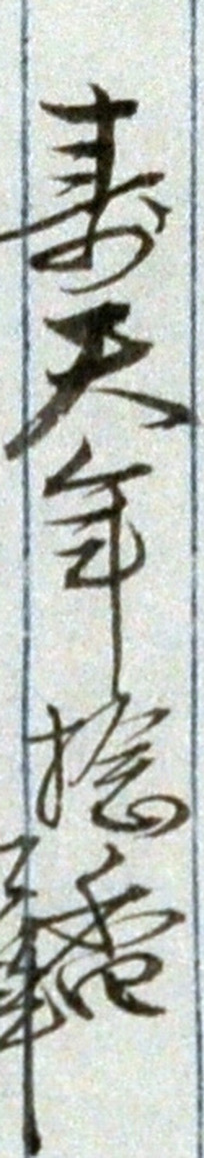寿天年捻香
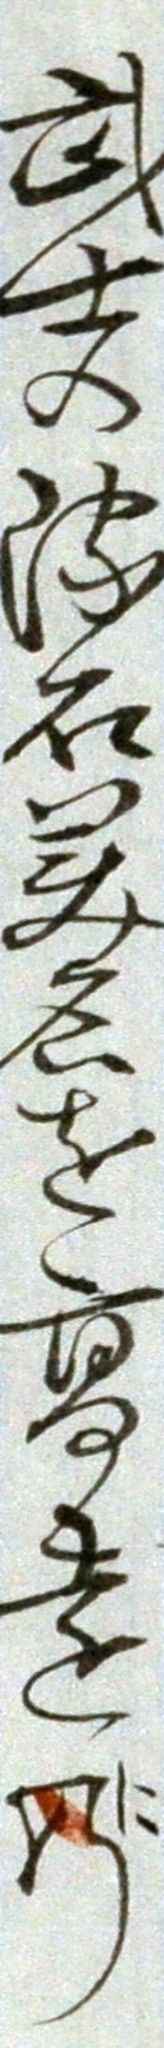武士の踏石美名を高遠に
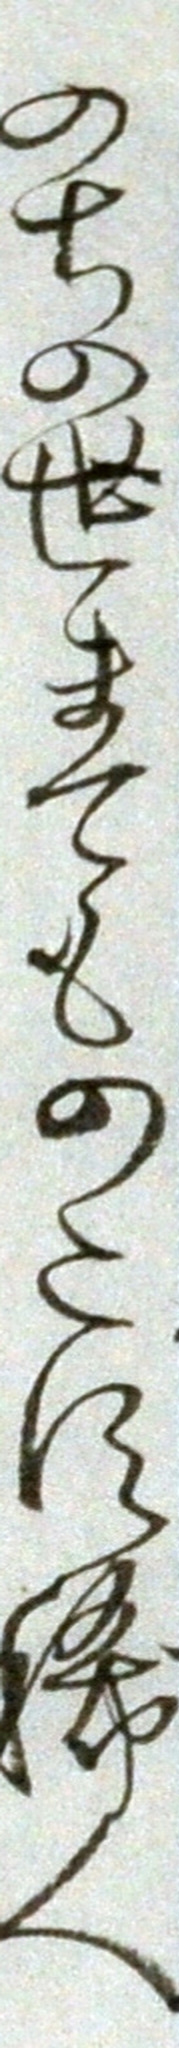のちの世まてものこ須稀人
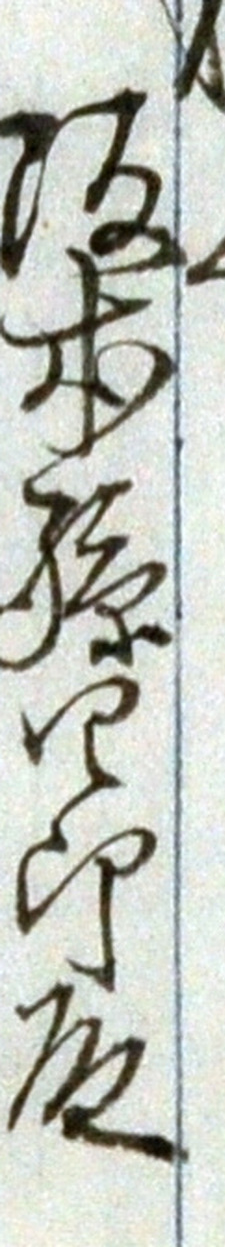坂本孫四郎殿
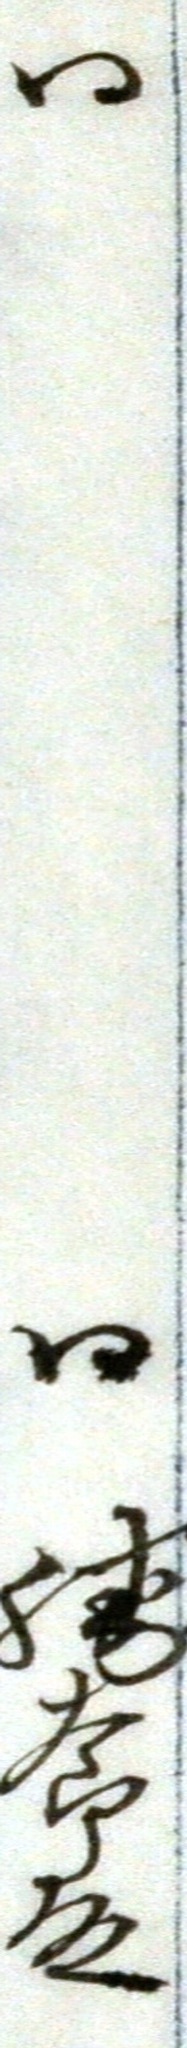同同勝太郎殿
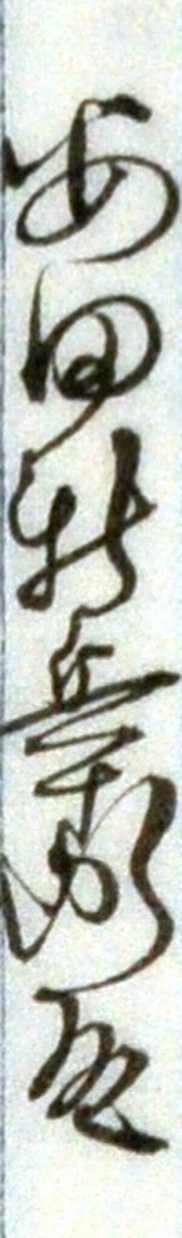同安田新兵衛殿
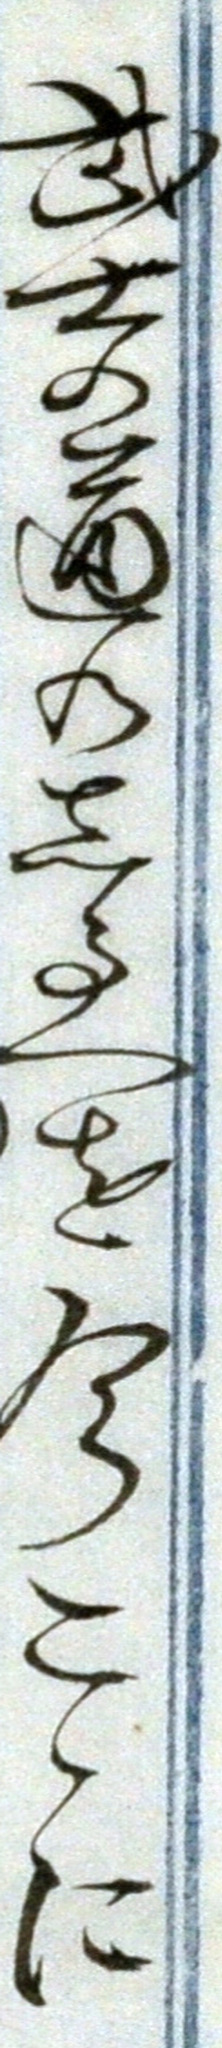武士の道の志るへを今こ〃に
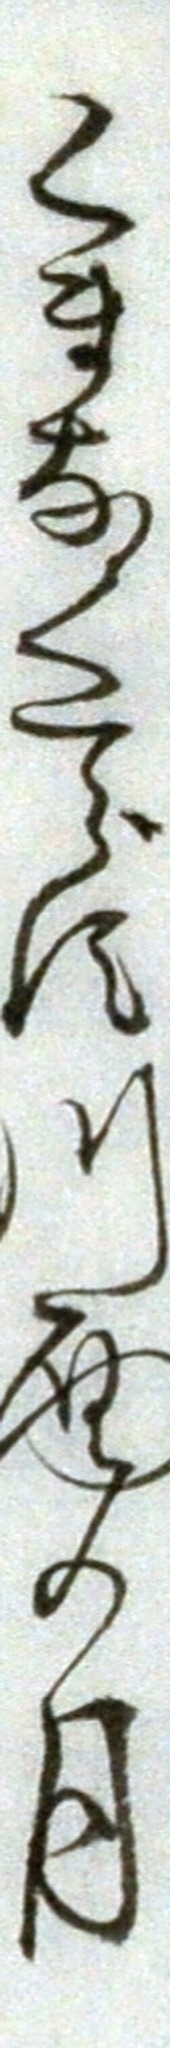くま奈くてら須川面の月
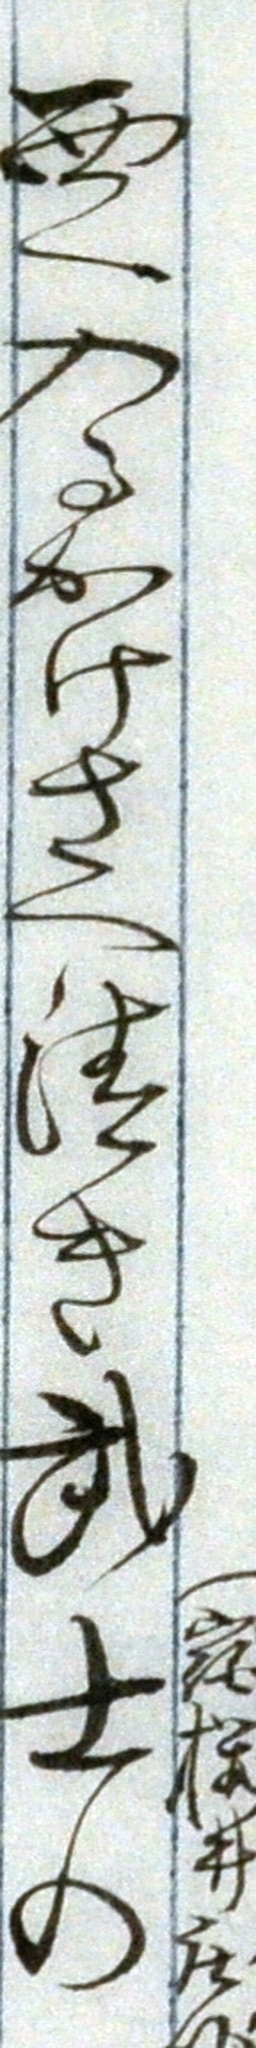西へ入るかけさへ清き武士の
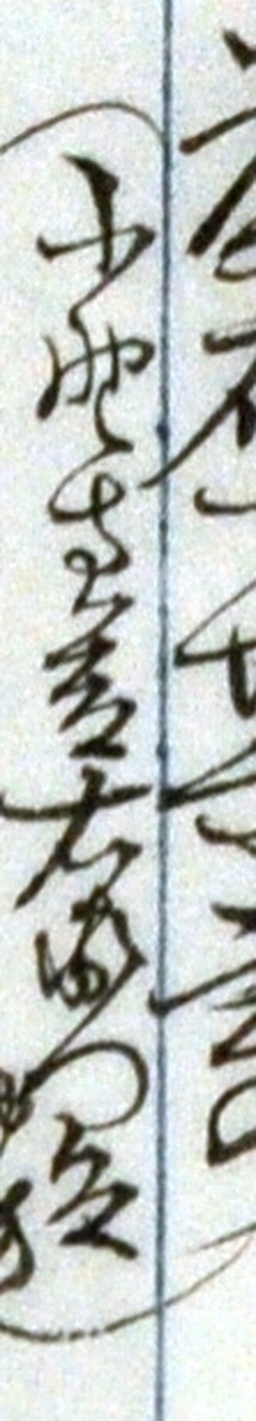₍小野寺善右衛門殿
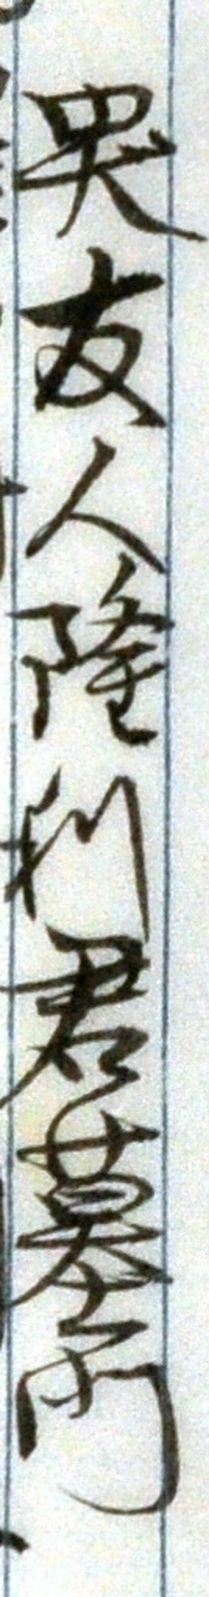哭友人隆利君墓門
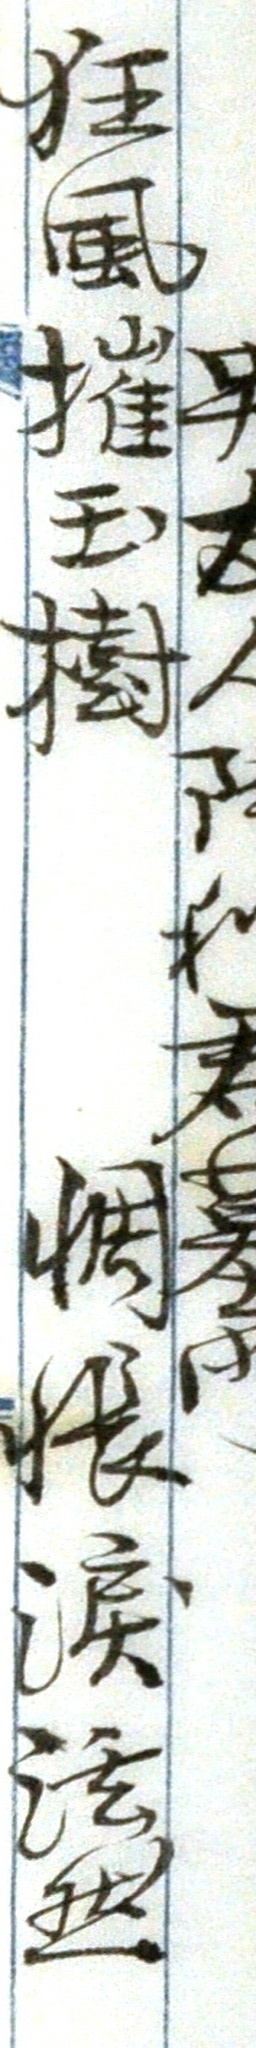狂風擕玉樹惆帳涙泫然

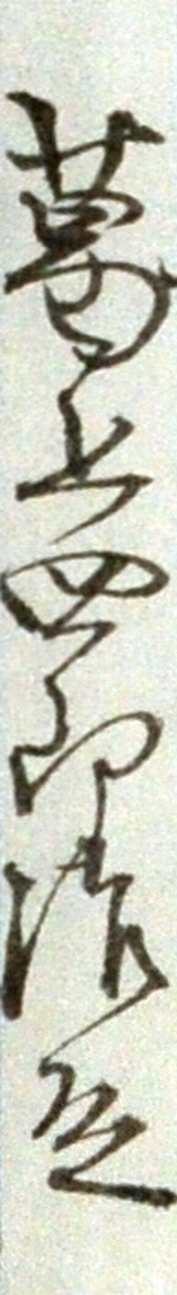葛上四郎治殿
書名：川面小藤太子細有之多賀谷唯右衛門ヲ打果候一件
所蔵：伊那市立高遠町図書館・合同会社AMANE
